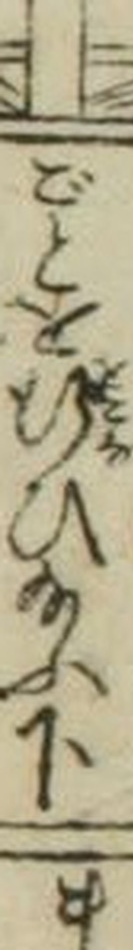ごとを行ひ給ふ下
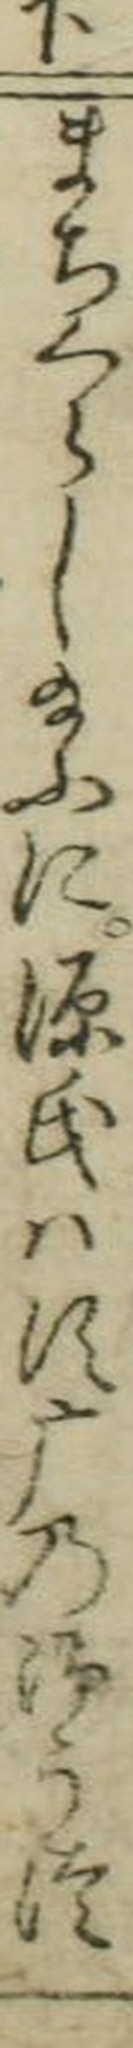まちくらし給ふに。源氏は須磨の御うつ
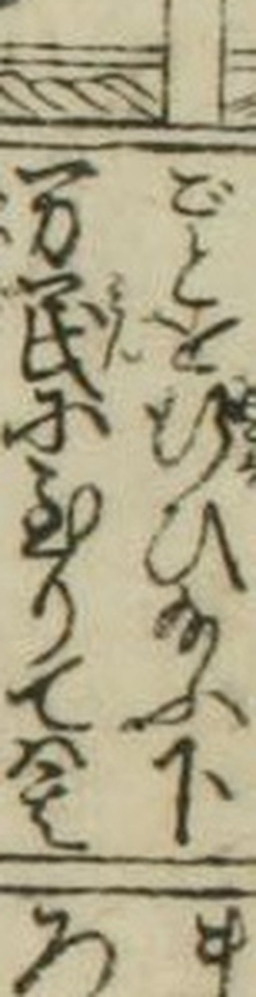万民に至りては其
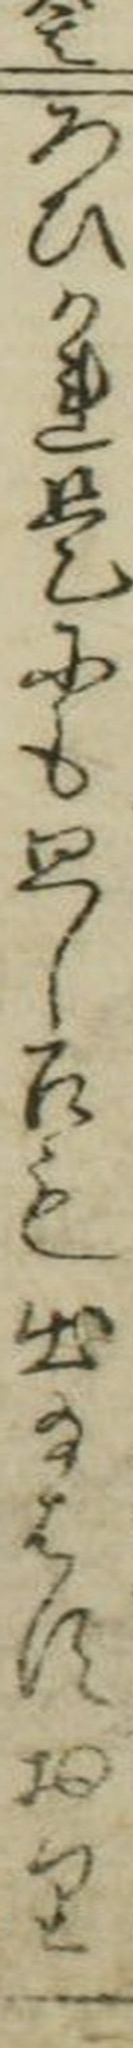ろひかれ是にも思し召も出給はすおり
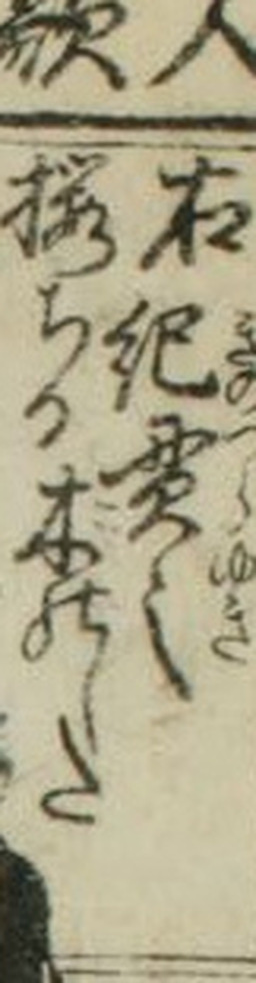桜ちる木のした
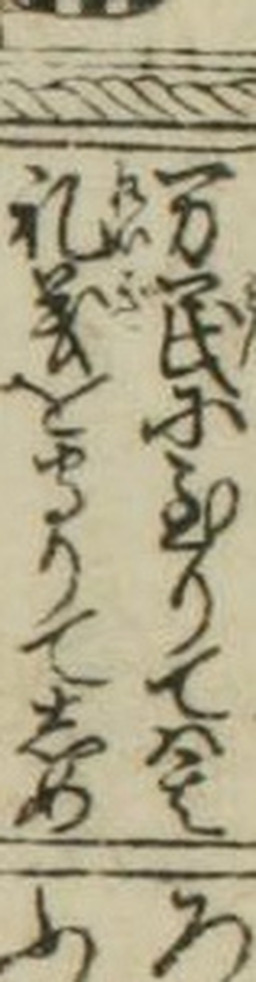礼義を守りてしめ
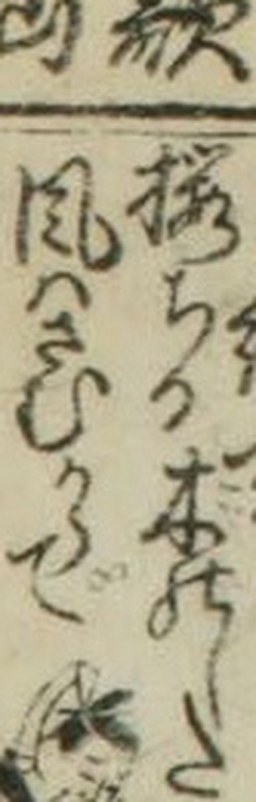風はさむからで
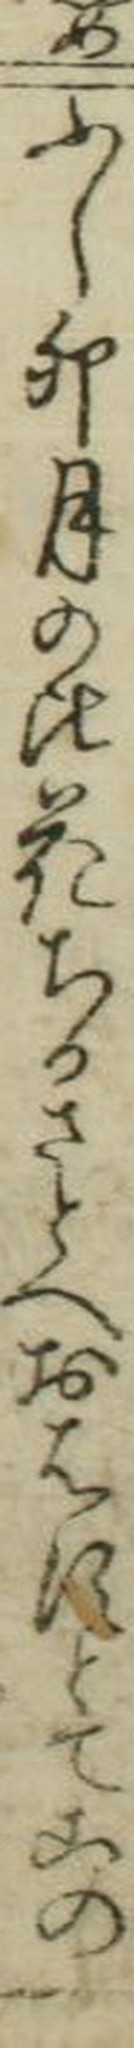ふし卯月の比花ちるさとへおはすとてこの
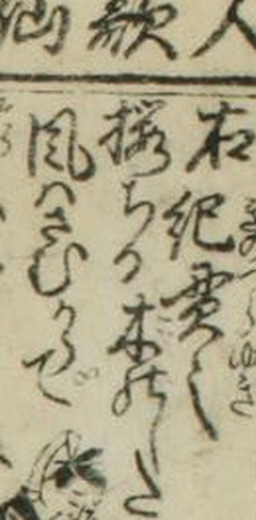風はさむからで
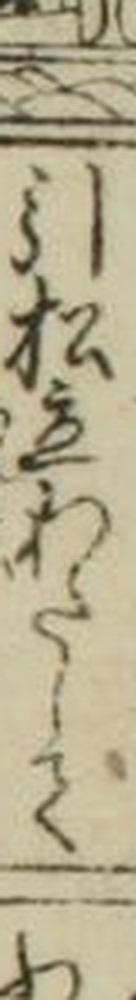引松立わたして
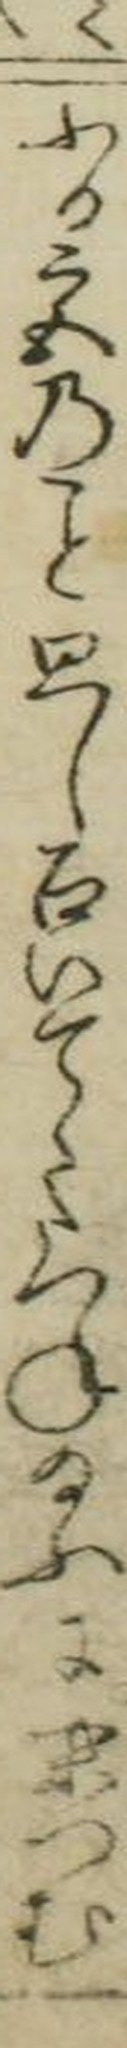ふる宮のこと思し召いてゝたつね給ふに。末つむ
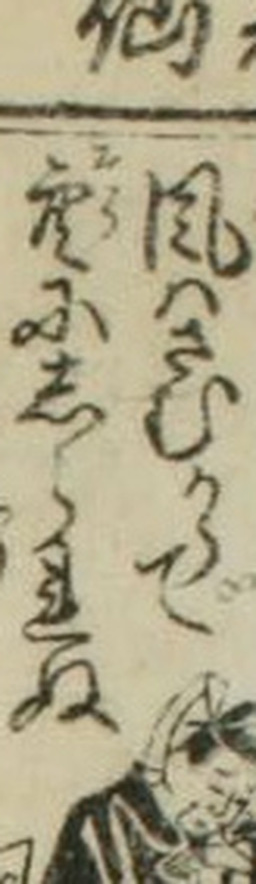空にしられぬ
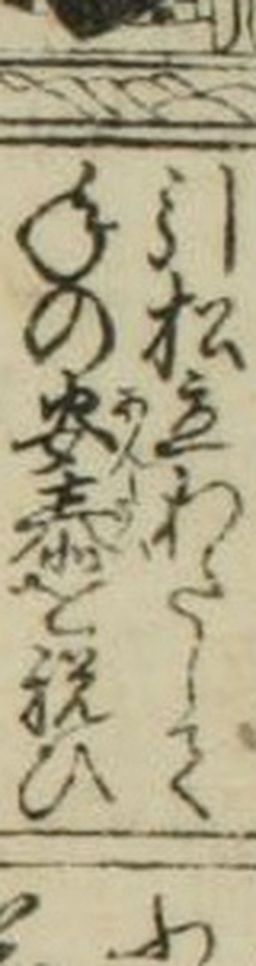年の安泰を祝ひ
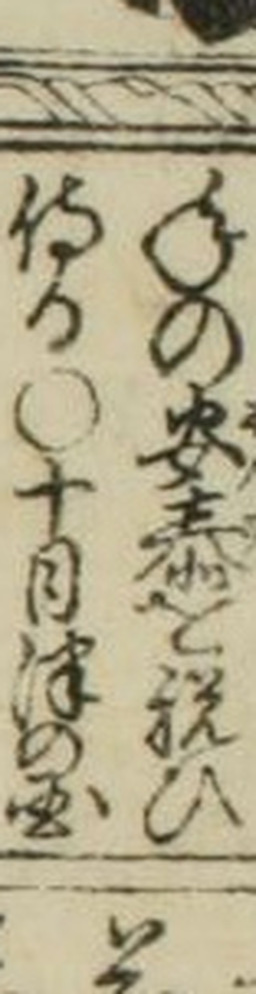侍る○十日津の国
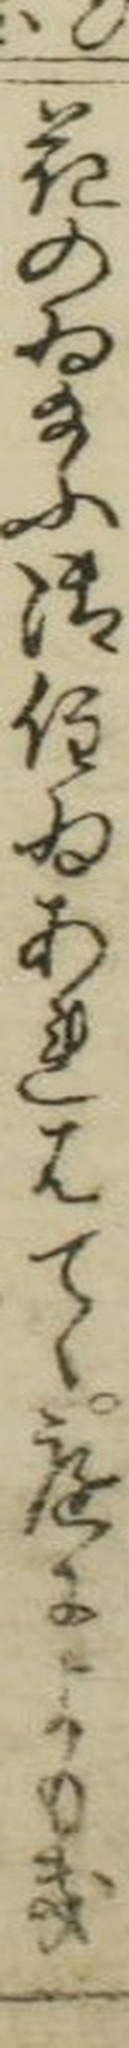花のゐ給ふ御住ゐあれはてゝ。庭によもき
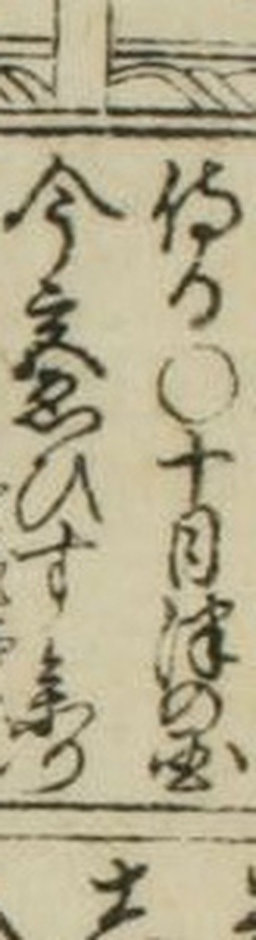今宮ゑひす参り
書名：女源氏教訓鑑
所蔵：東京学芸大学附属図書館
